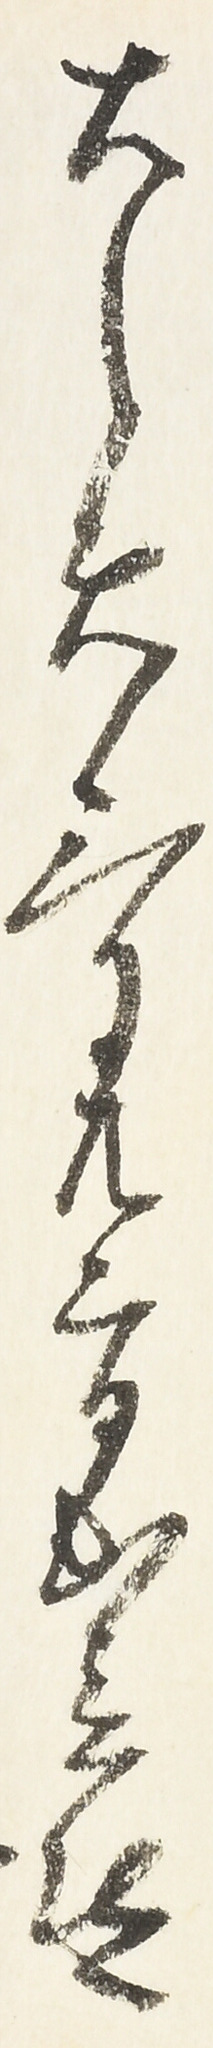右之者三月廿二日出立仕候
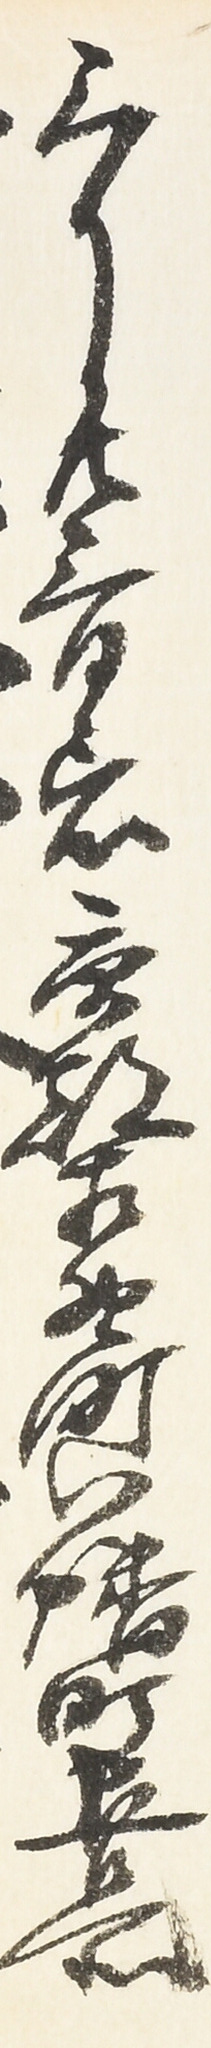三月廿三日着京都相野町八幡町上ル所
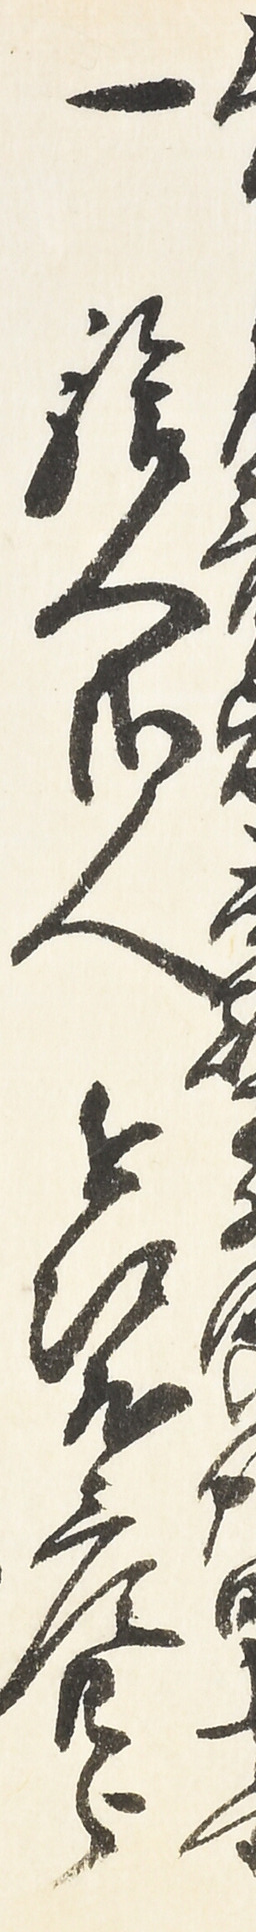一旅人弐人近江屋彦四郎
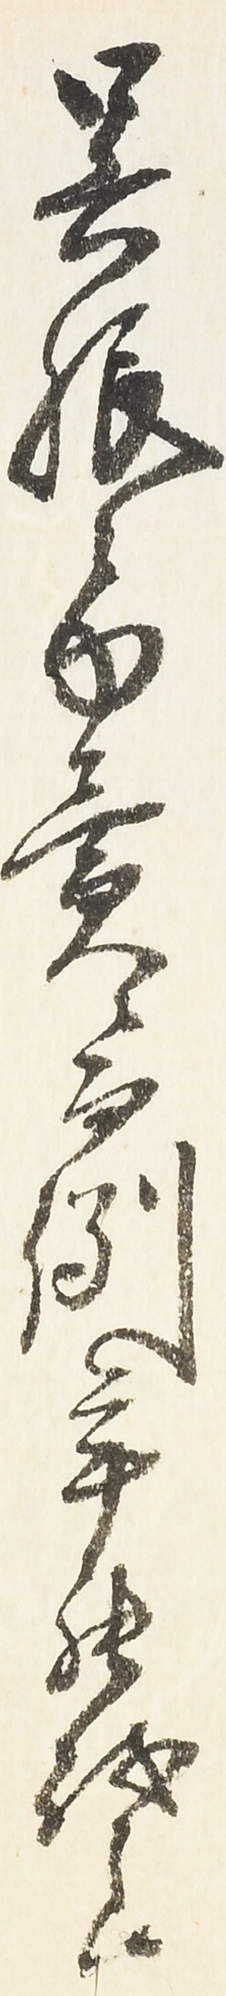呉服商売ニ而例年罷越申候
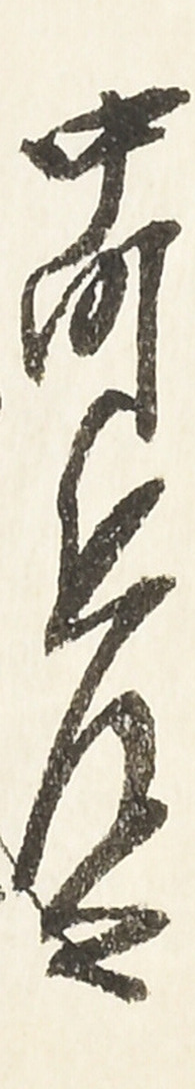中町近江や
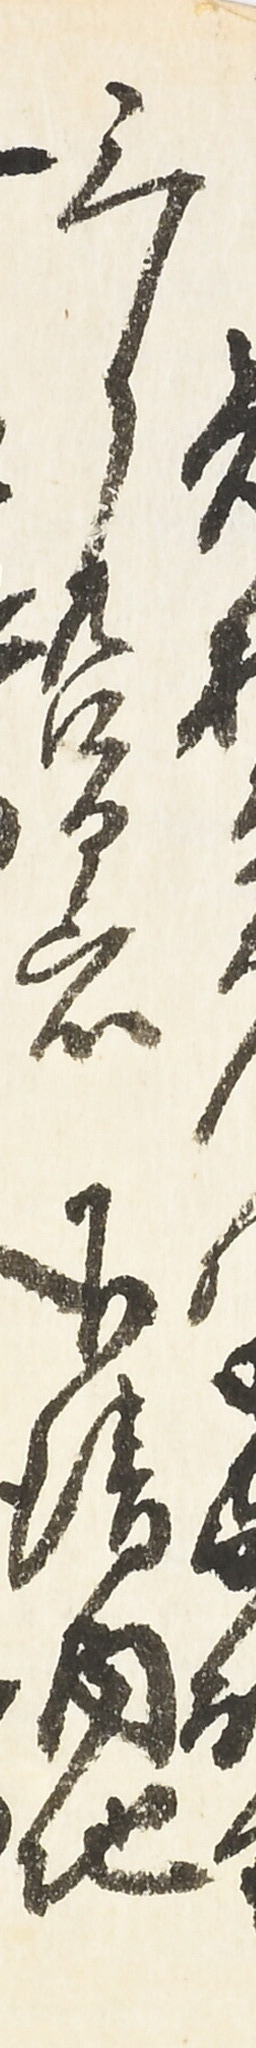三月廿四日着下清内地
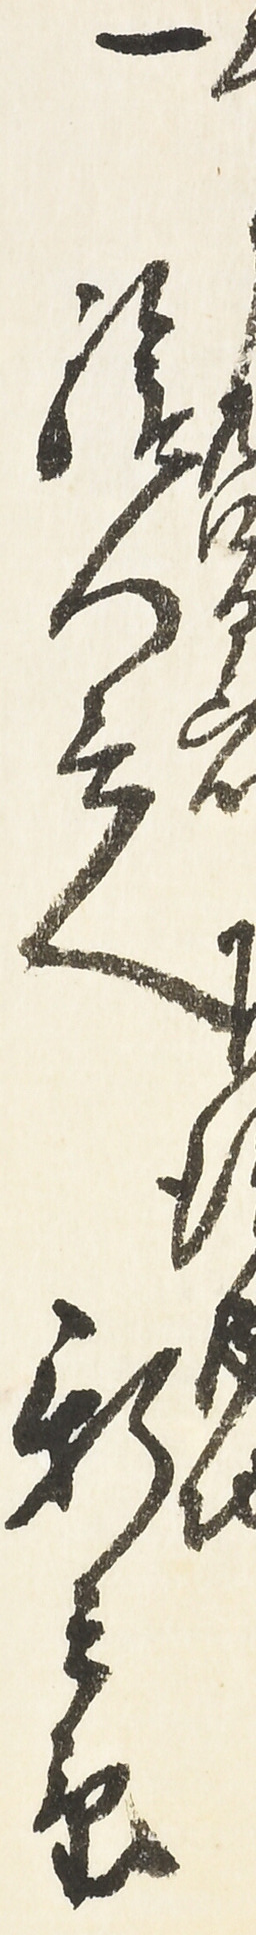一旅人壱人新兵衛
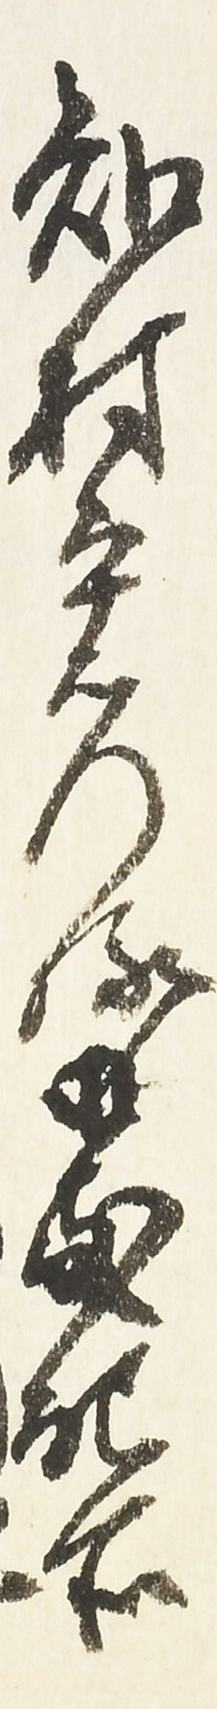知村平右衛門様御支配所
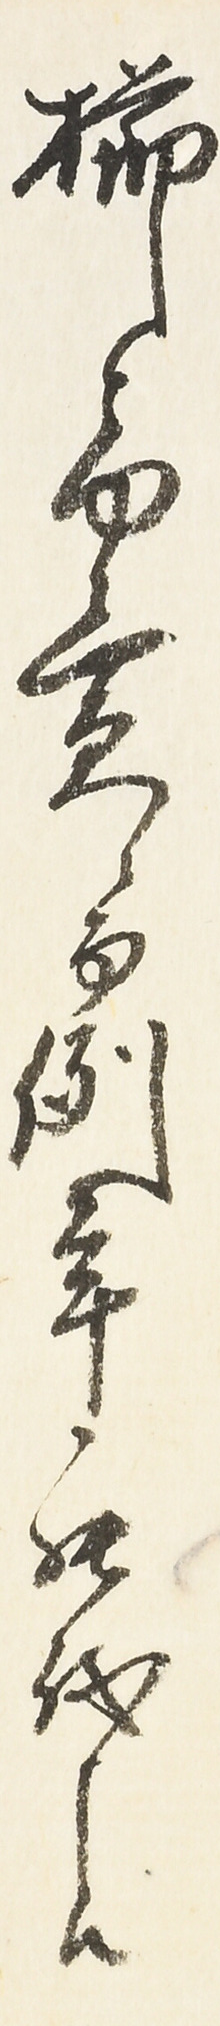櫛商売ニ而例年罷越申候
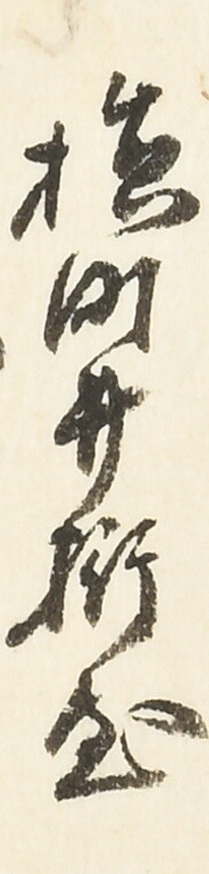横町井桁屋
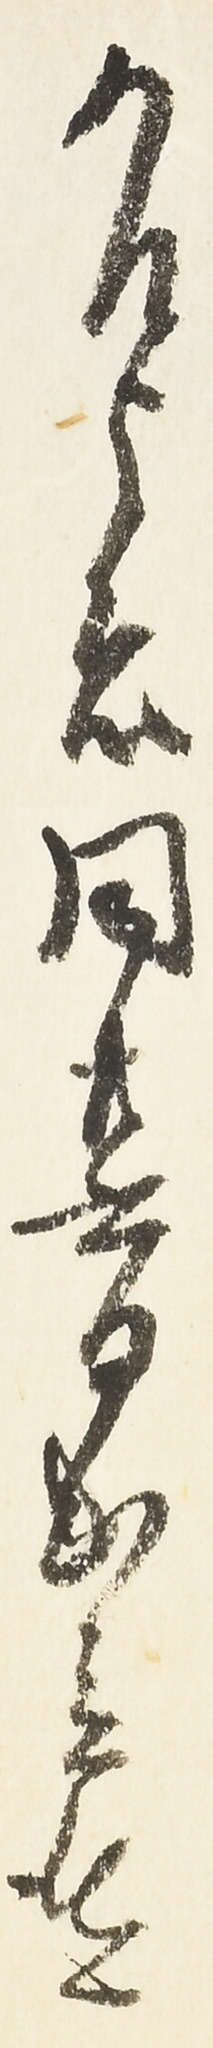右之者同廿六日出立仕候
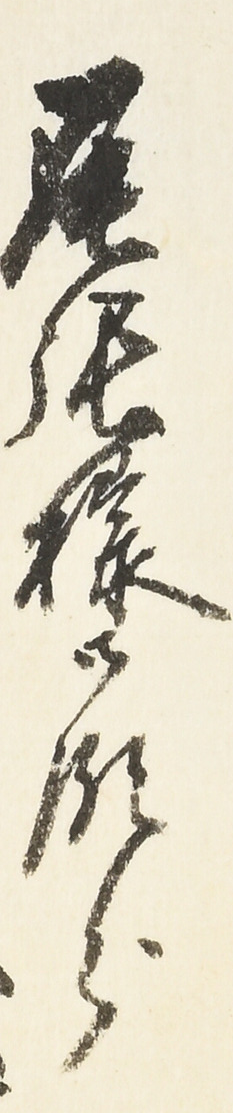尾張様御領分
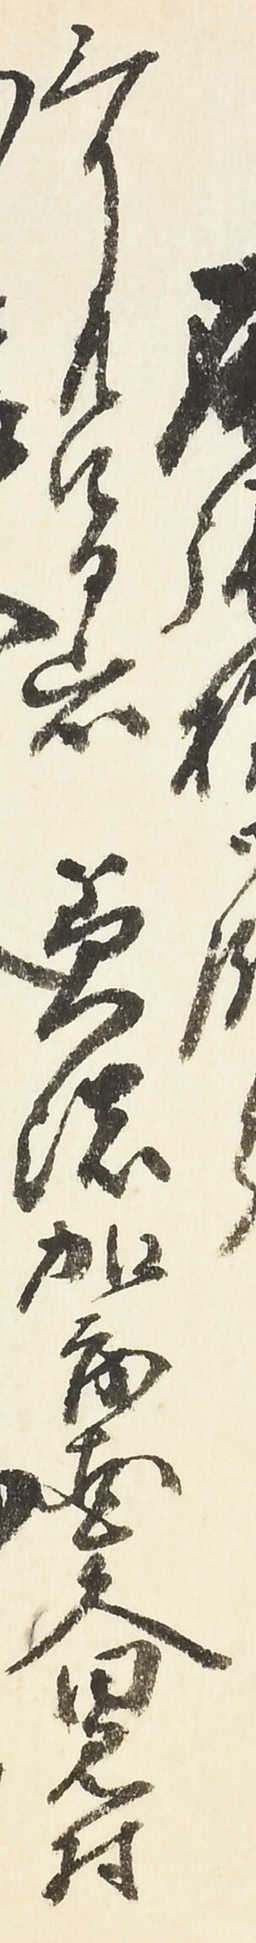三月廿四日着美濃加茂固久田見村
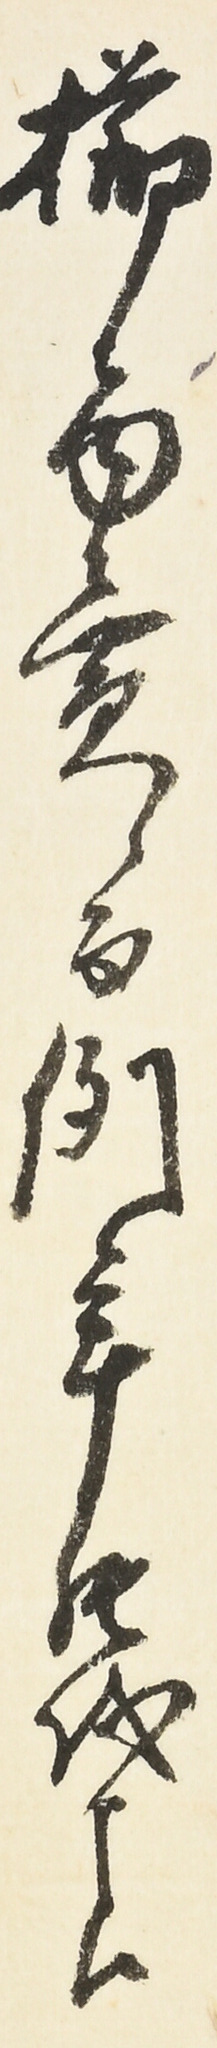櫛商売ニ而例年罷越申候
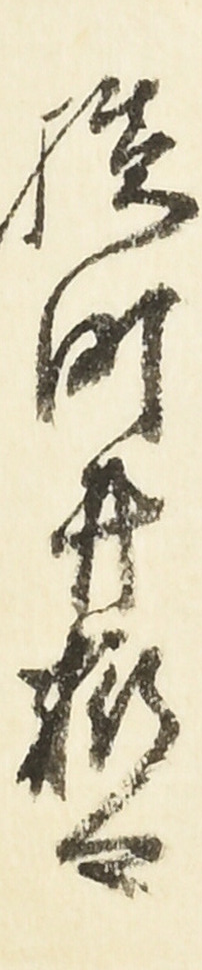横町井桁屋
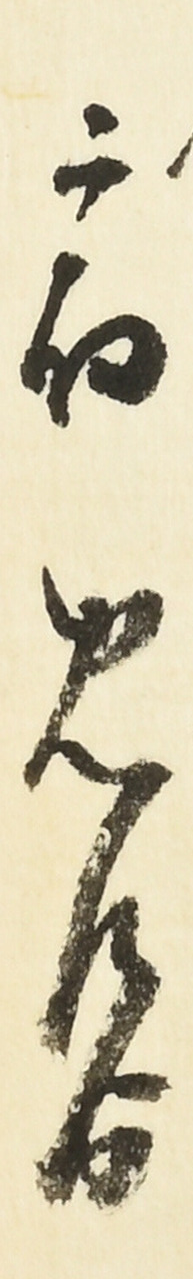宿忠左衛門
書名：町中旅人泊控帳
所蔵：伊那市立高遠町図書館・合同会社AMANE
